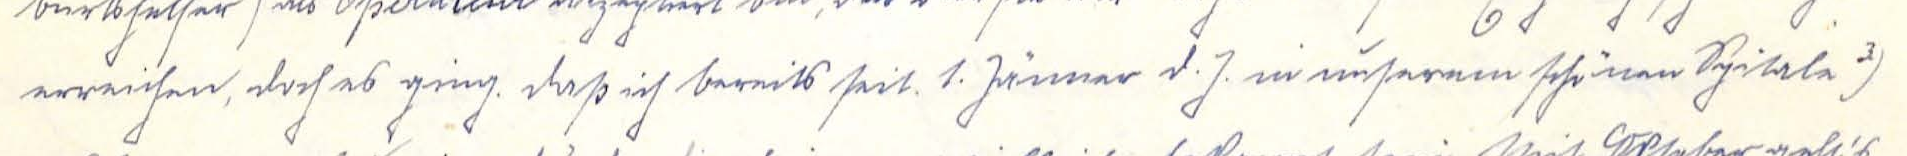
erreichen, doch es ging. Daß ich bereits seit 1. Jänner d. J. in unserem schönen Spitale 3.)
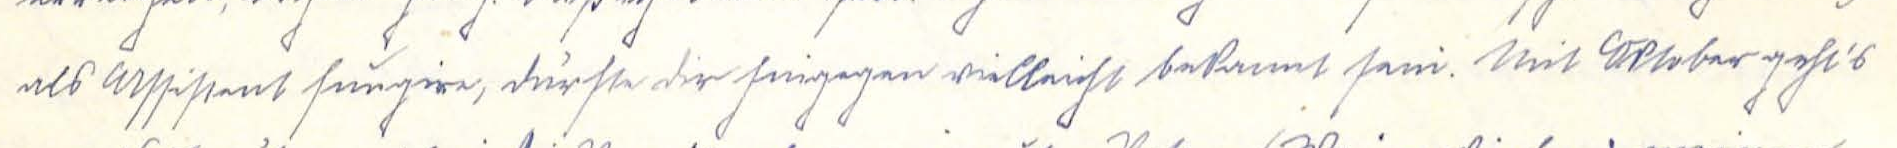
als Assistent fungiere, dürfte dir hingegen vielleicht bekannt sein. Mit Oktober geht's
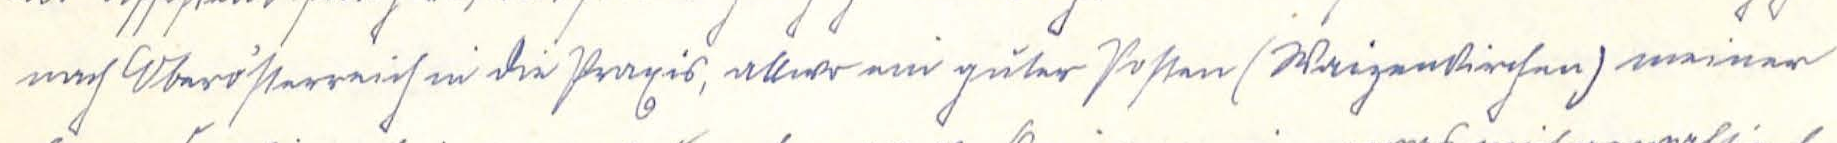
nach Oberösterreich in die Praxis, allwo ein guter Posten (Waizenkirchen) meiner
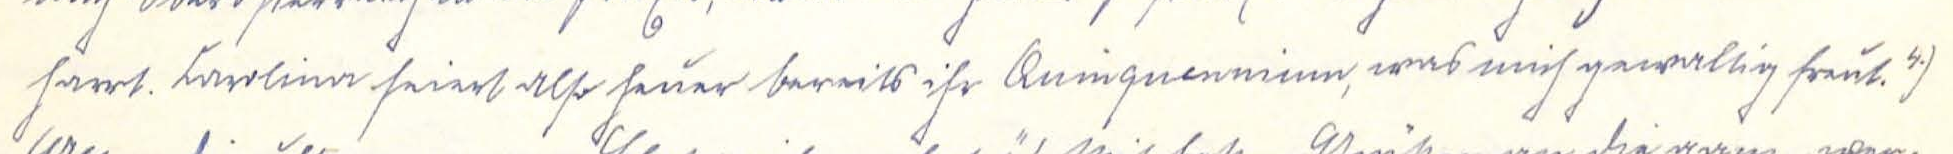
harrt. Carolina feiert also heuer bereits ihr Quinquenium, was mich gewaltig freut. 4.)
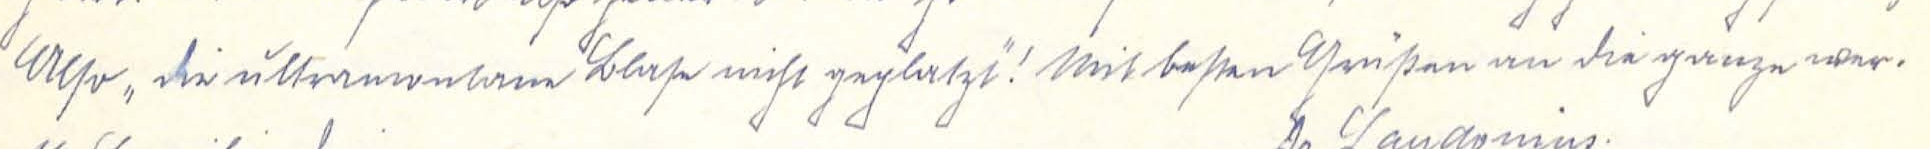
Also "Die ultramontane Blase nicht geplatzt"! Mit besten Grüßen an die ganze wer-
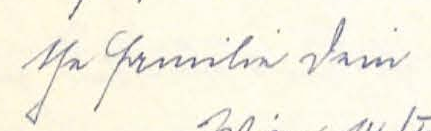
the Familie dein
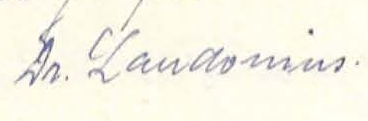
Dr. Laudonius
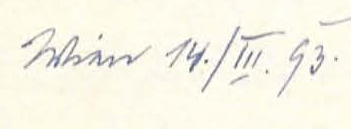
Wien 14. / III. 93.
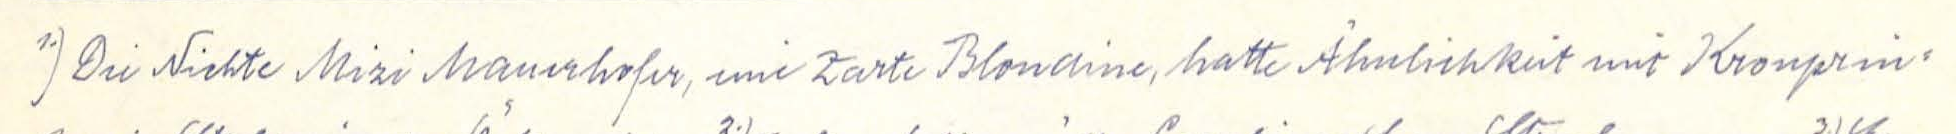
1.) Die Nichte Mizi Mauerhofer, die zarte Blondine, hatte Ähnlichkeit mit Kronprin-
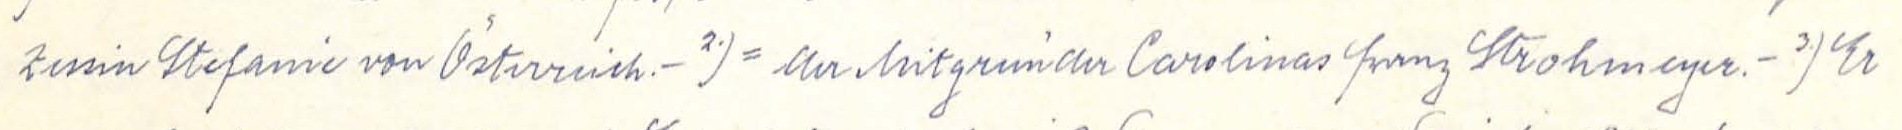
zessin Stefanie von Österreich.- 2.) Der Mitgründer Carolinas Franz Strohmeyer.- 3.) Er
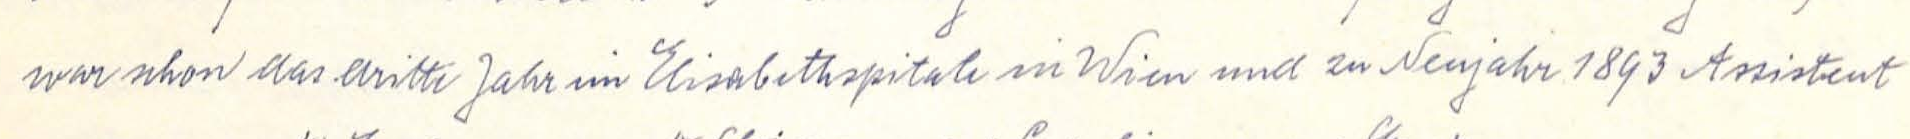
war schon das dritte Jahr im Elisabethspitale in Wien und zu Neujahr 1893 Assistent
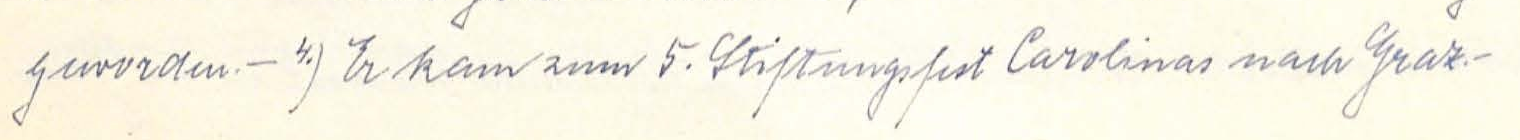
geworden.- 4.) Er kam zum 5. Stiftungsfest Carolinas nach Graz.-
